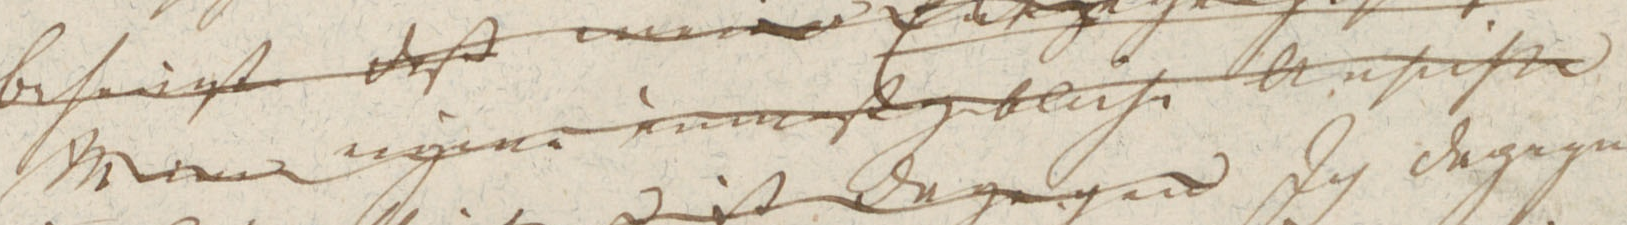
Meine eigene unmassgebliche Ansicht
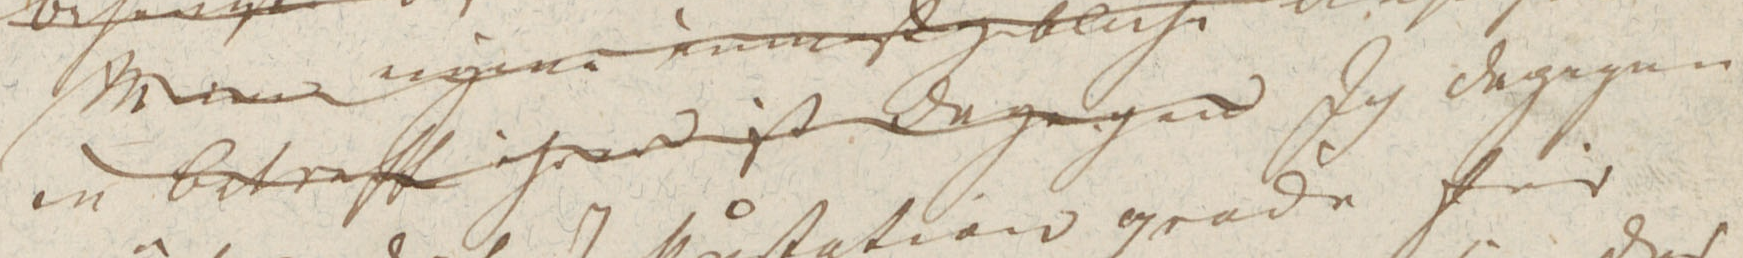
in Betreff ihrer ist dagegen Ich dagegen
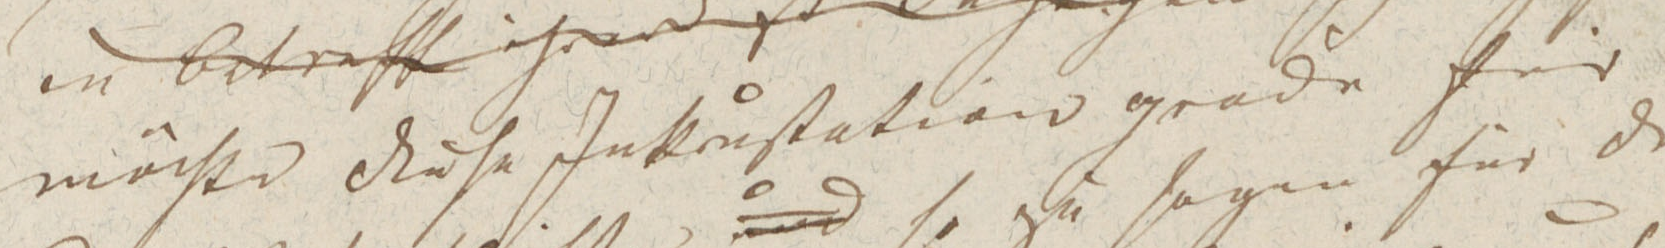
möchte diese Inkrustation grade für
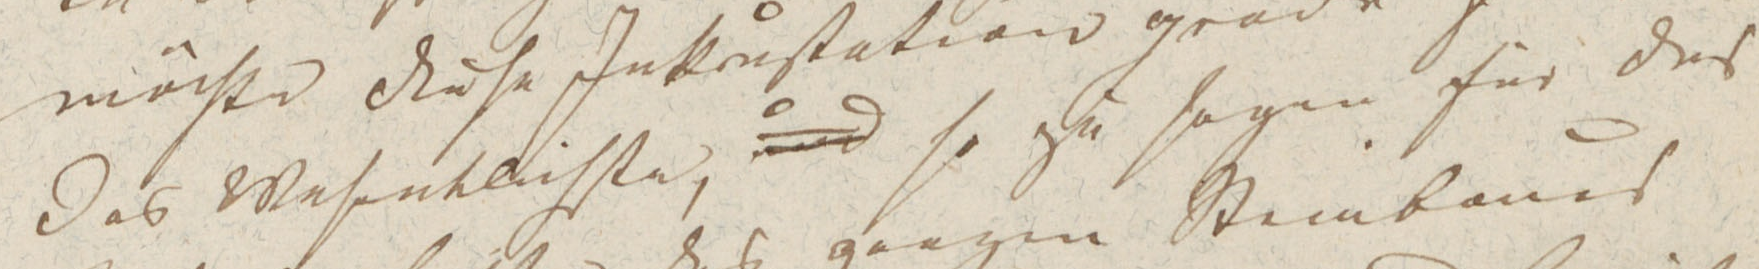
das Wesentlichste, und so zu sagen für das
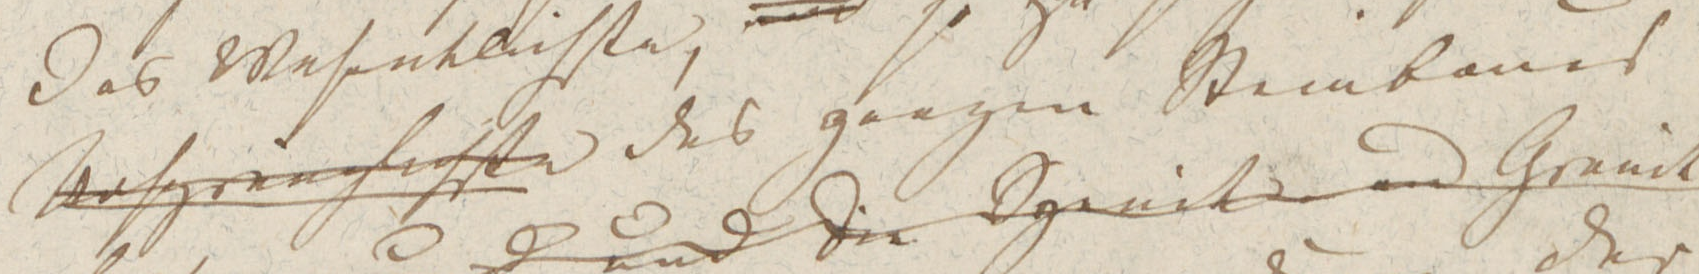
Ursprünglichste des ganzen Steinbaues
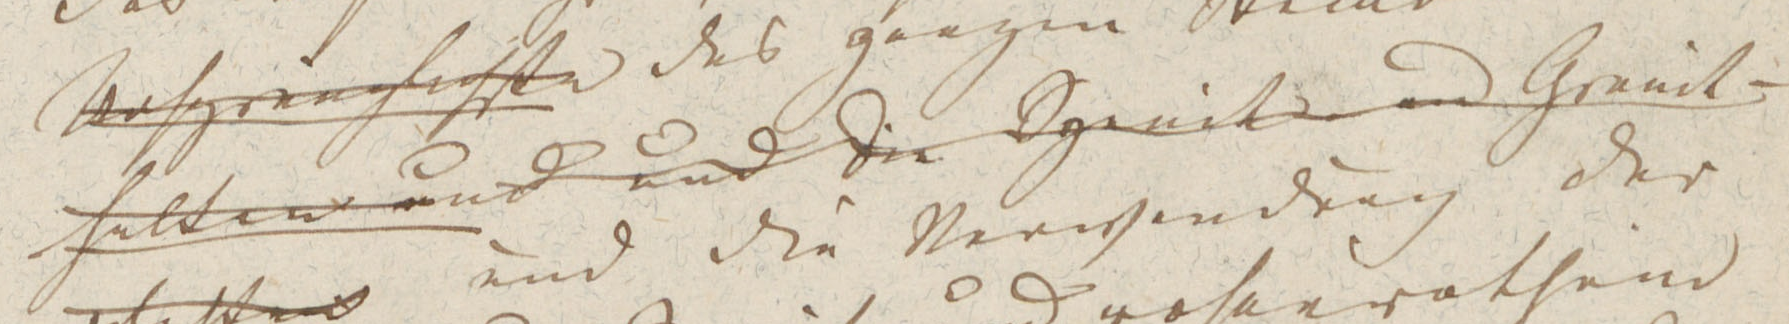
halten und und die Syenit- und Granit-
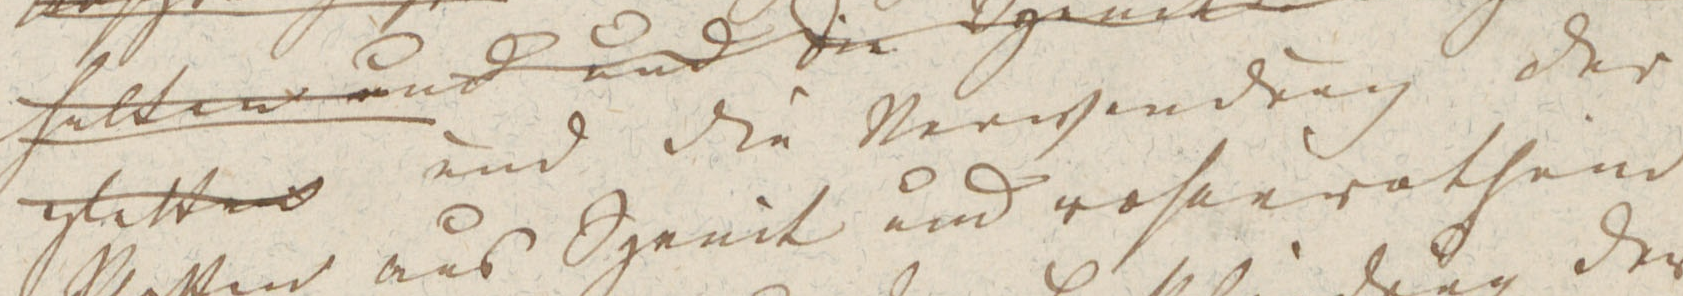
platten und die Verwendung der
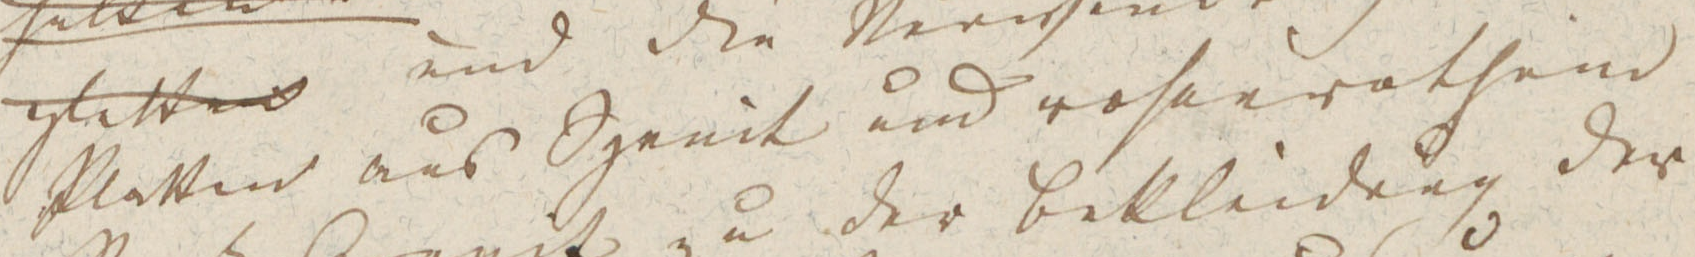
Platten aus Syenit und rosenrothem
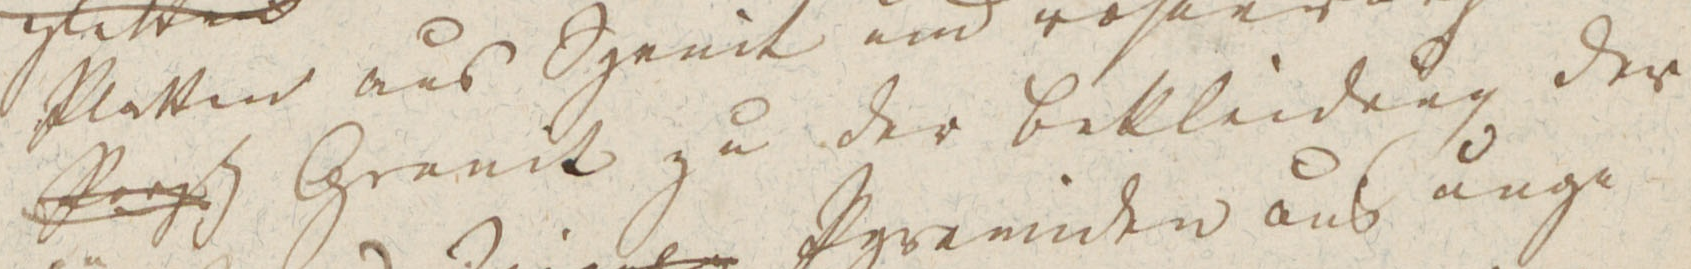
Porph Granit zu der Bekleidung der
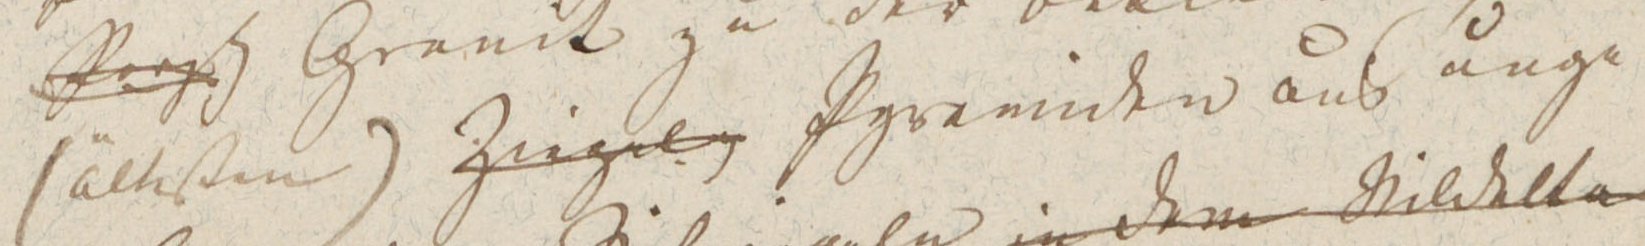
(ältesten) Ziegel, Pyramiden aus unge
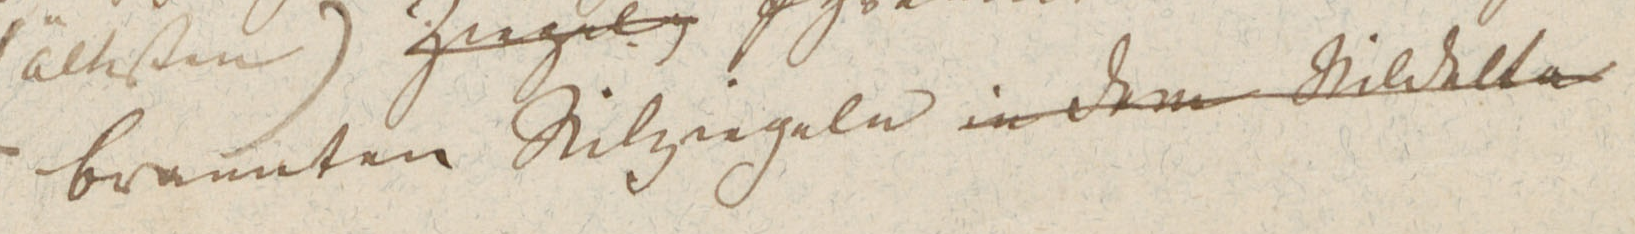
brannten Nilziegeln in dem Nildelta
